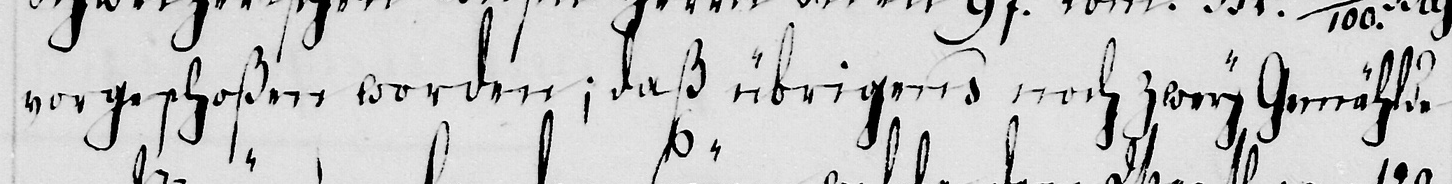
vorgeschoßen worden; daß übrigens noch zwey Gemählde
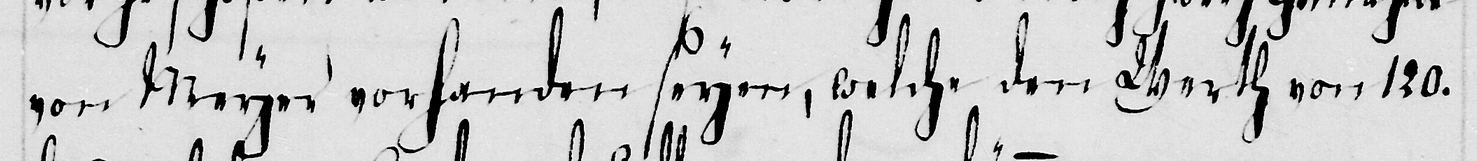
von Meyer vorhanden seyen, welche den Werth von 120.
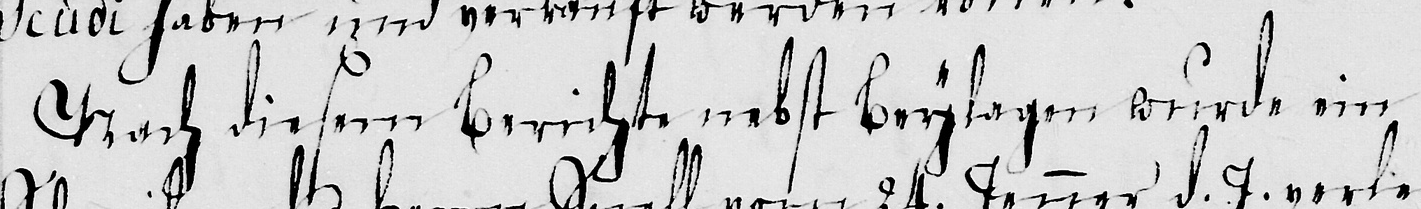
Nach diesem Berichte nebst Beylagen wurde ein
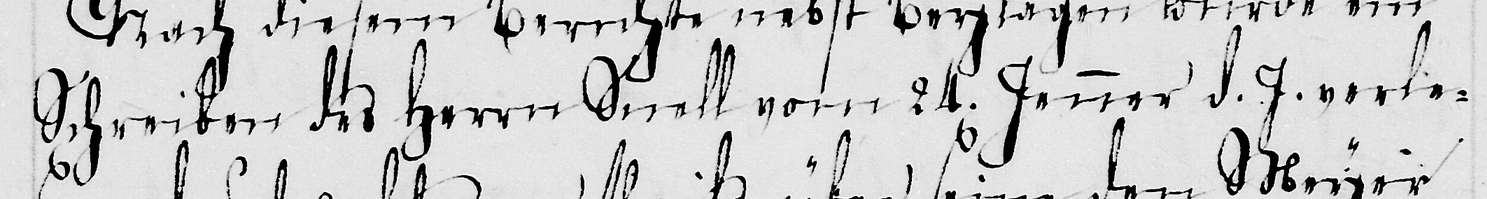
Schreiben des Herrn Snell vom 24. Jenner d. J. verle¬
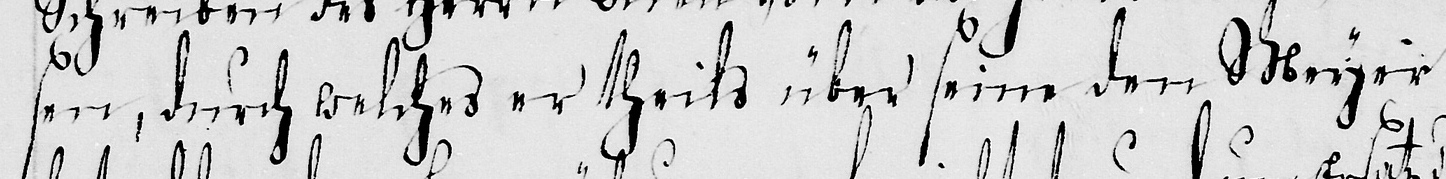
sen, durch welches er theils über seine den Meyer
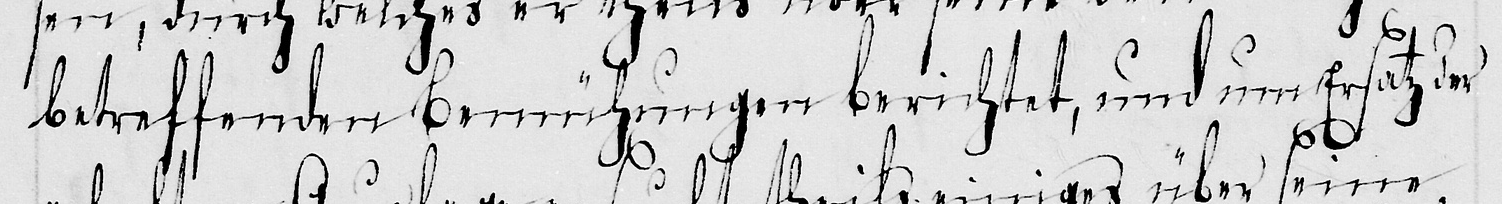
betreffenden Bemühungen berichtet, und um Ersatz d¬
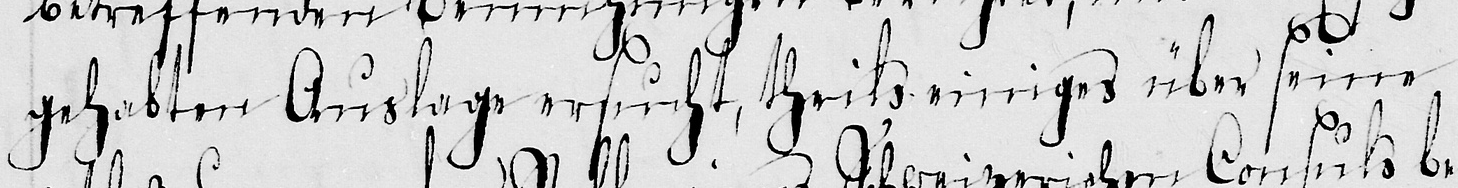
gehabten Auslagen ersucht, theils einiges über seine
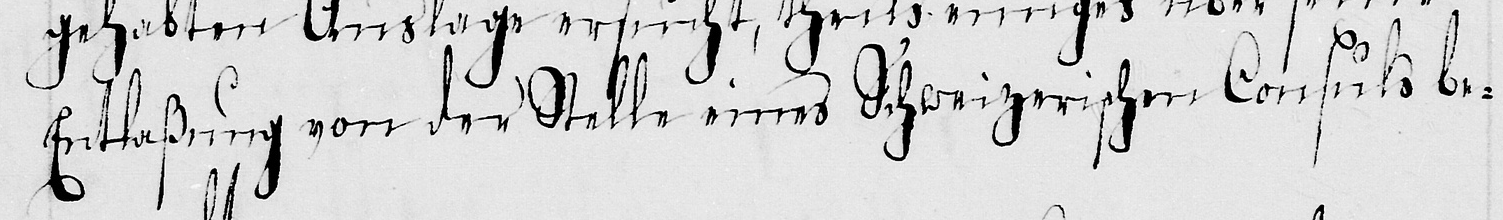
Entlaßung von der Stelle eines Schweizerischen Consuls be¬
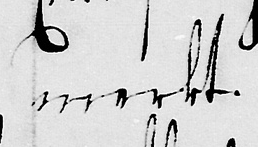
merkt.
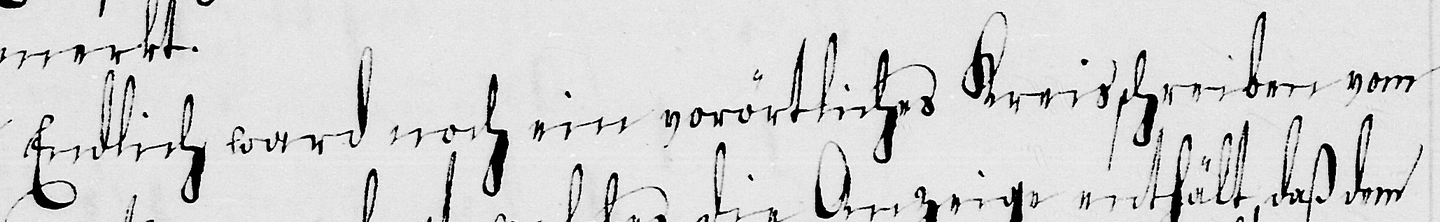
Endlich ward noch ein vorörtliches Kreisschreiben vom
